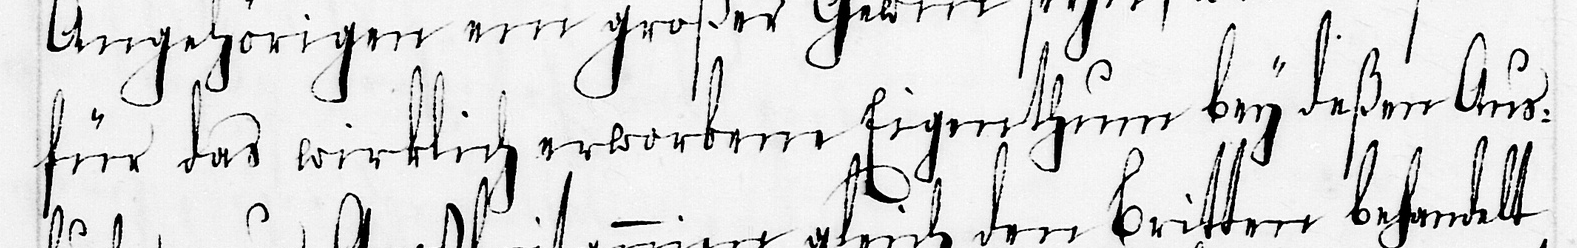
für das wirklich erworbene Eigenthum bey deßen Aus¬
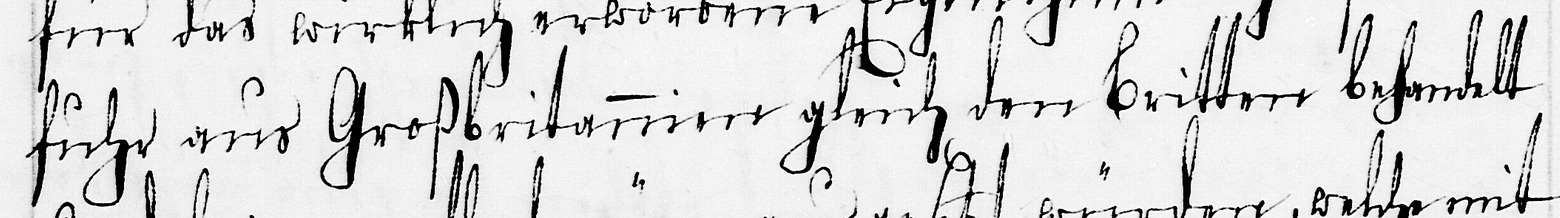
fuhr aus Großbritannien gleich den Britten behandelt
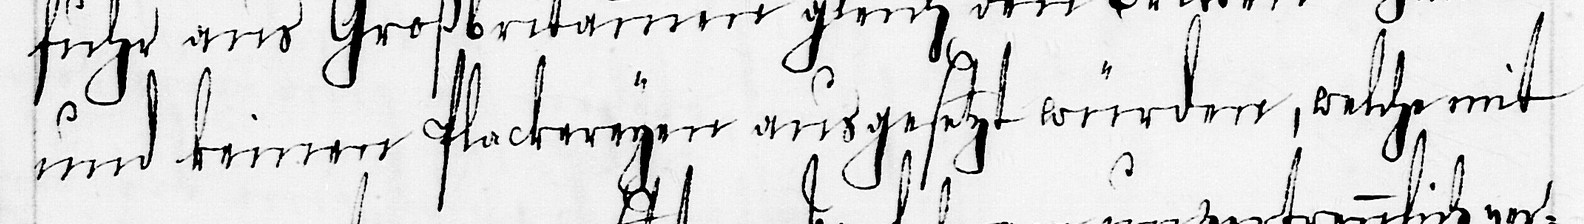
und keiner Plackereyen ausgesetzt würden, welche mit
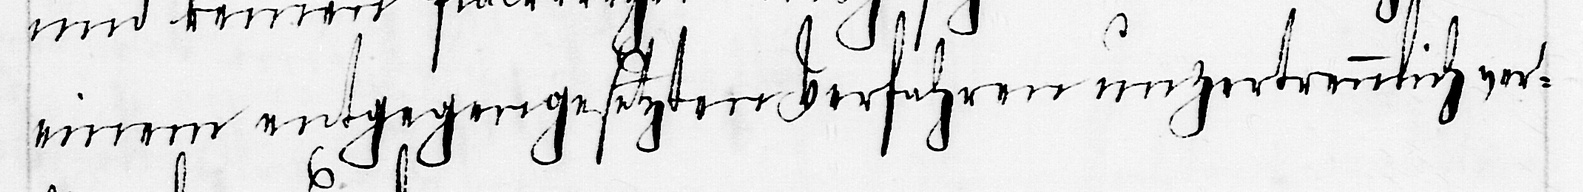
einem entgegengesetzten Verfahren unzertrennlich ver¬
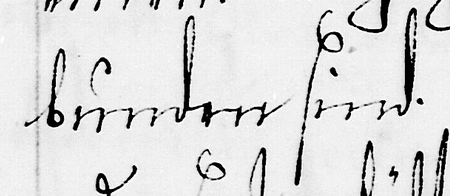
bunden sind.
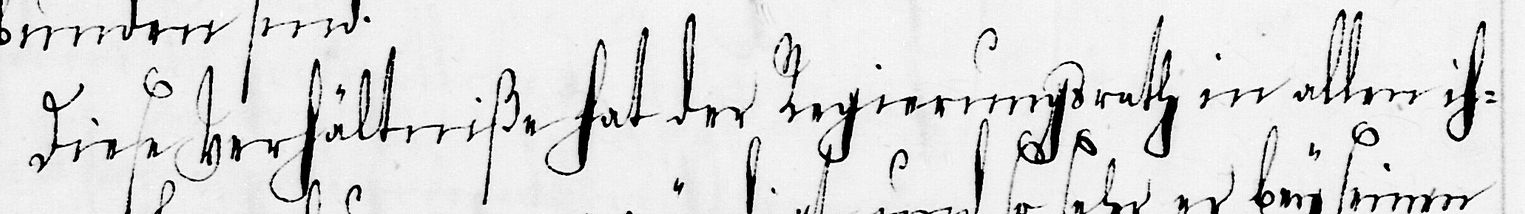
Diese Verhältniße hat der Regierungsrath in allen ih¬
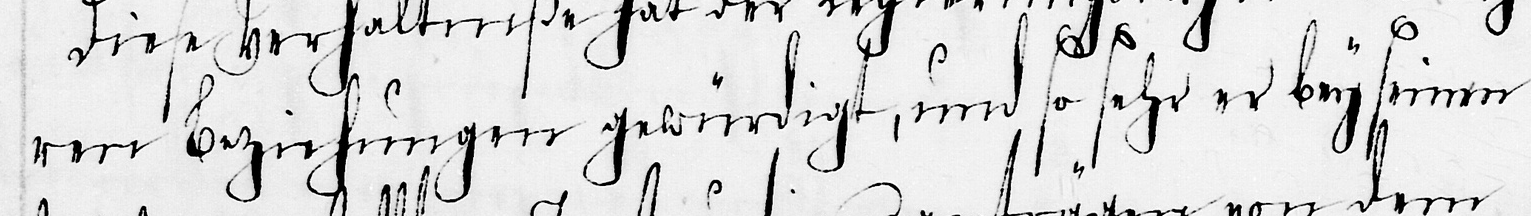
ren Beziehungen gewürdigt, und so sehr er bey seinen
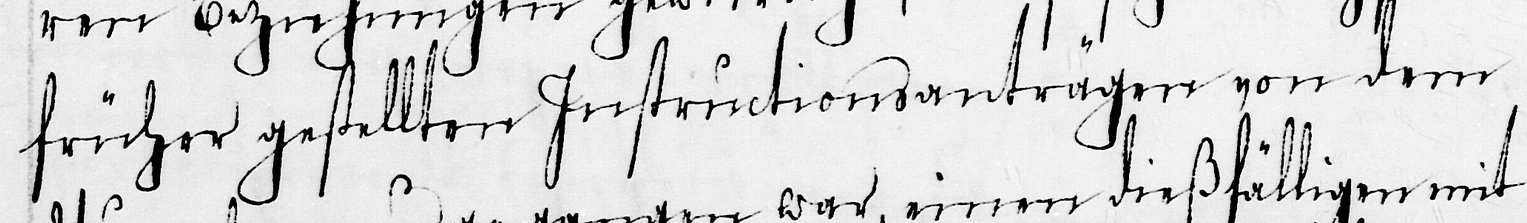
früher gestellten Instructionsanträgen von dem
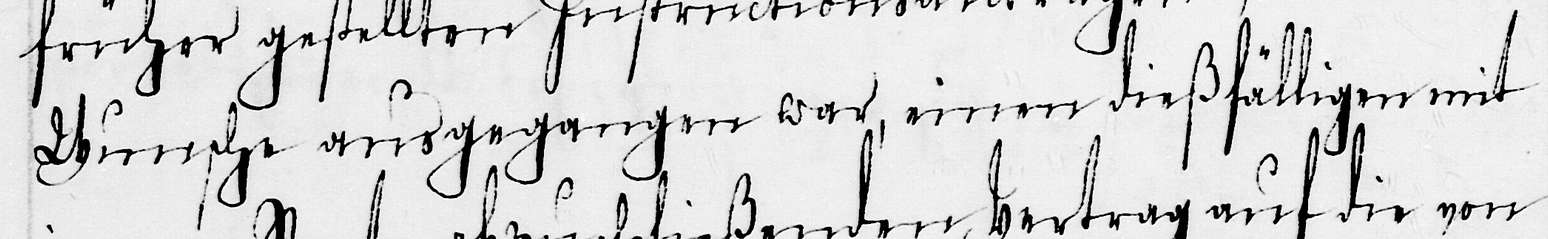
Wunsche ausgegangen war, einen dießfälligen mit
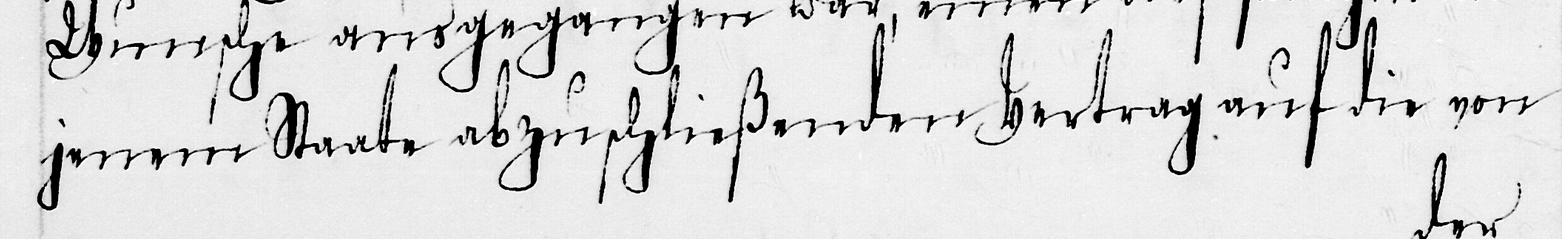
jenem Staate abzuschließenden Vertrag auf die von
